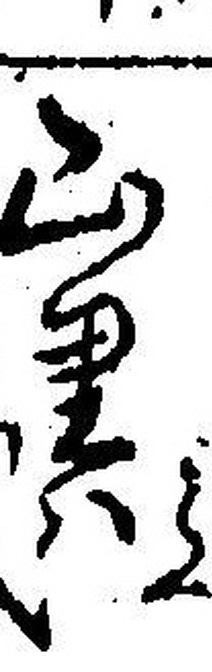山里は
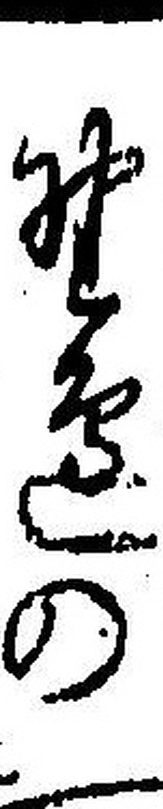野辺の
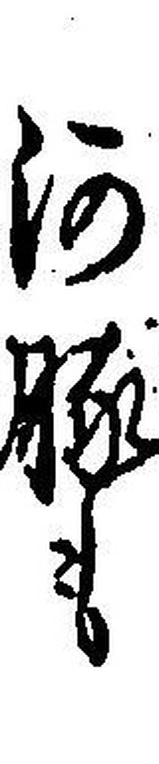河豚も
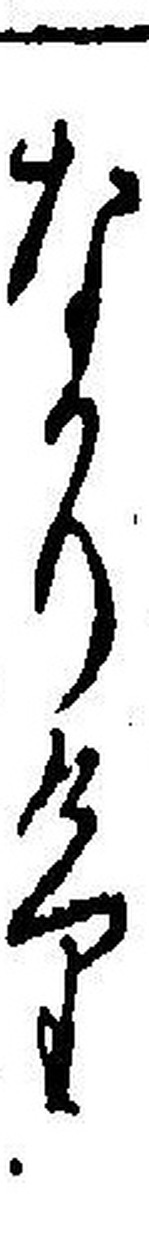なかりけり
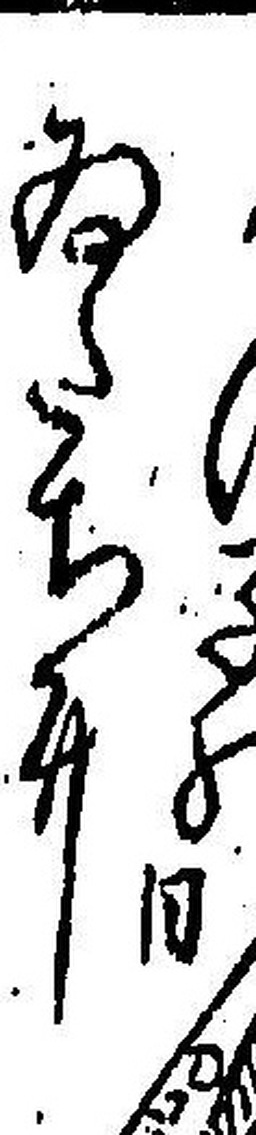ゐたちに
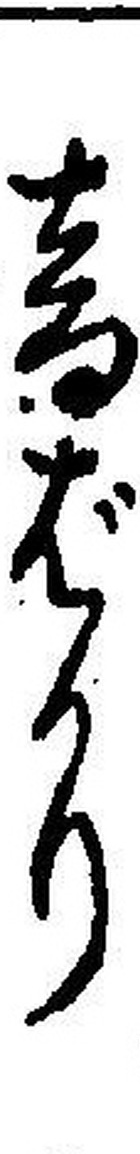音ばかり
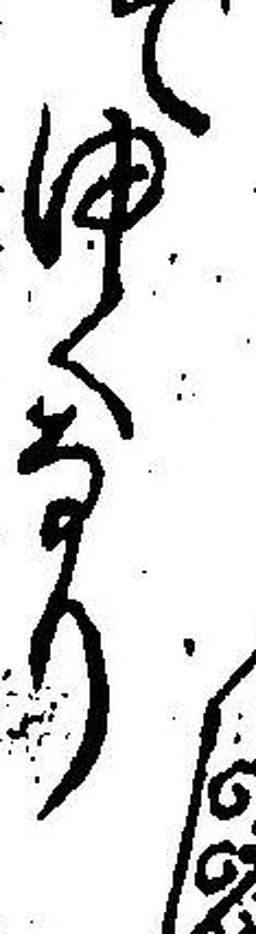ゆくなり
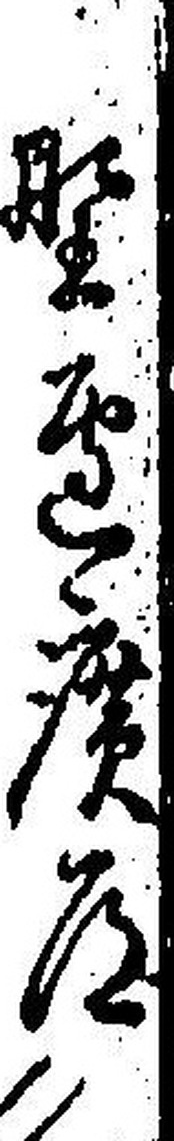野辺広道
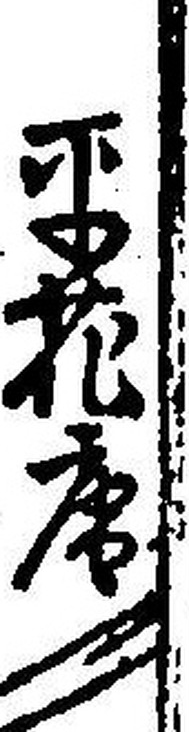平花庵
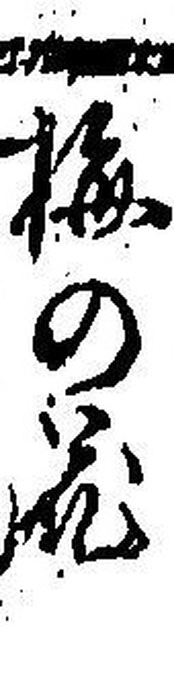梅の花
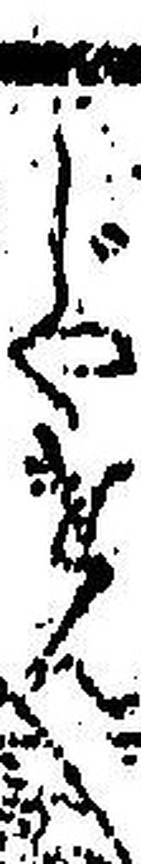じやけん
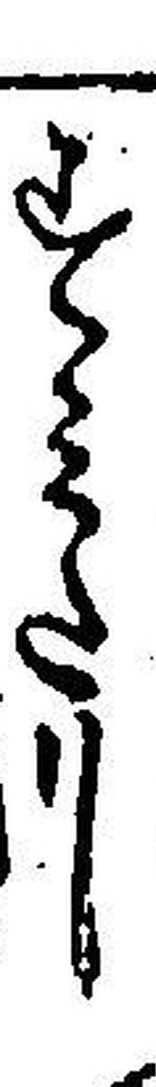すみた川
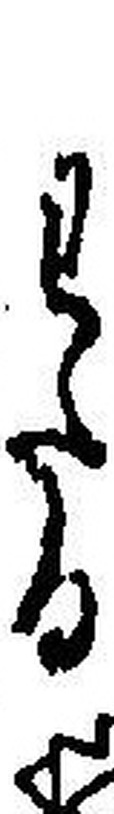わたる
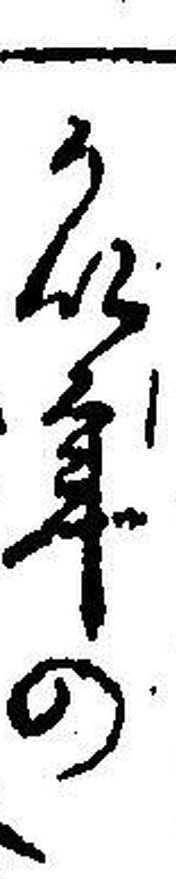うい年の
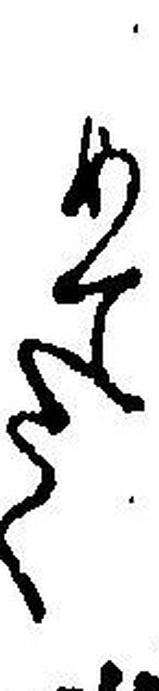えてたく
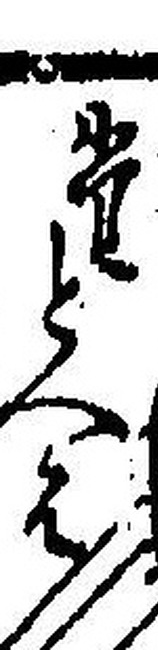たとへは
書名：どうれ百人一首 / 鹿都部真顔(狂歌堂)編
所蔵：東京大学総合図書館 General Library in the University of Tokyo, JAPAN
